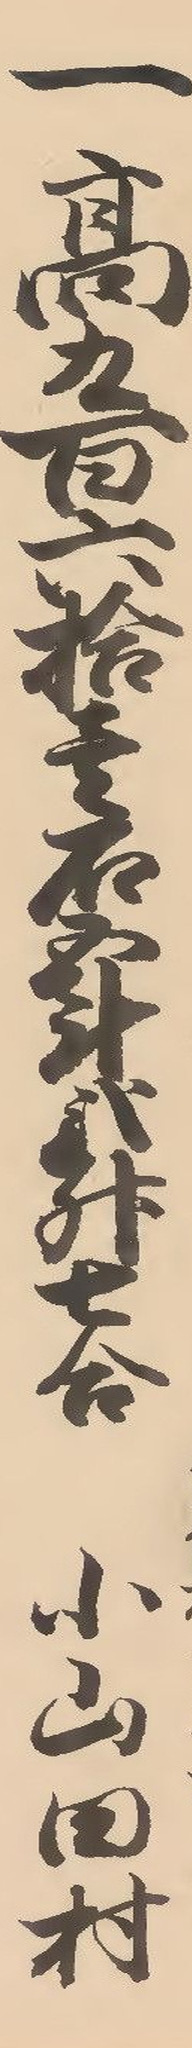一高九百六拾壱石五斗弐升七合小山田村
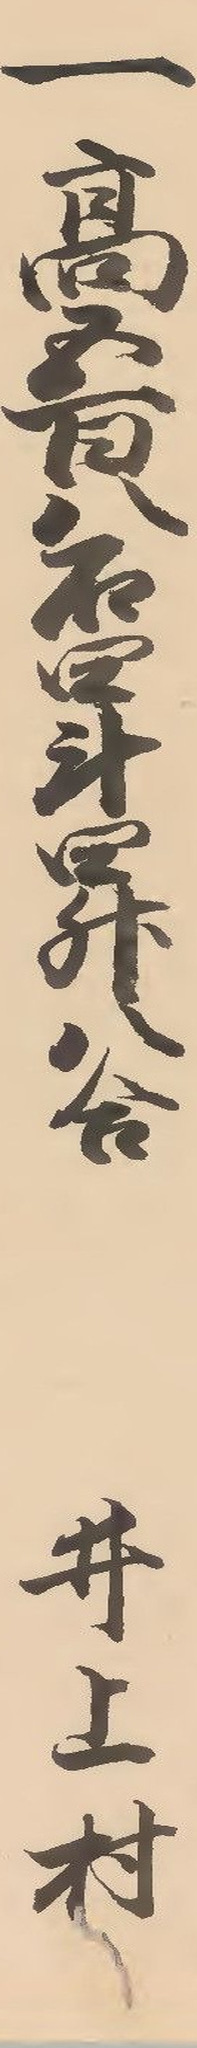一高五百八石四斗四升八合井上村
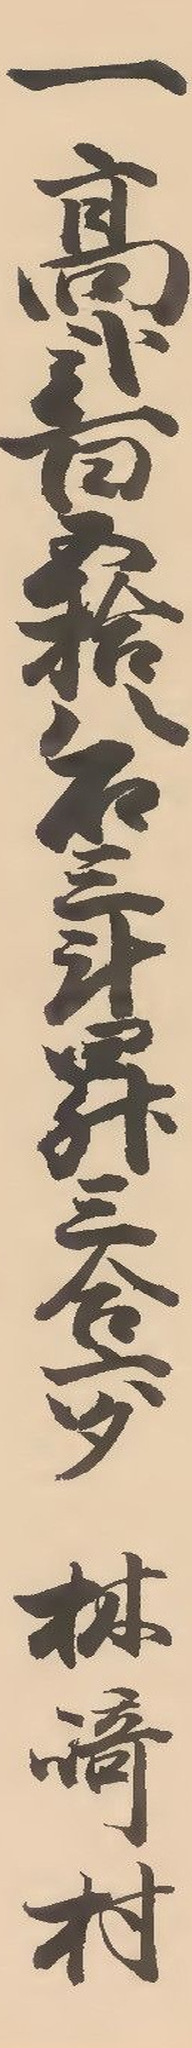一高弐百五拾八石三斗四升三合六勺林崎村
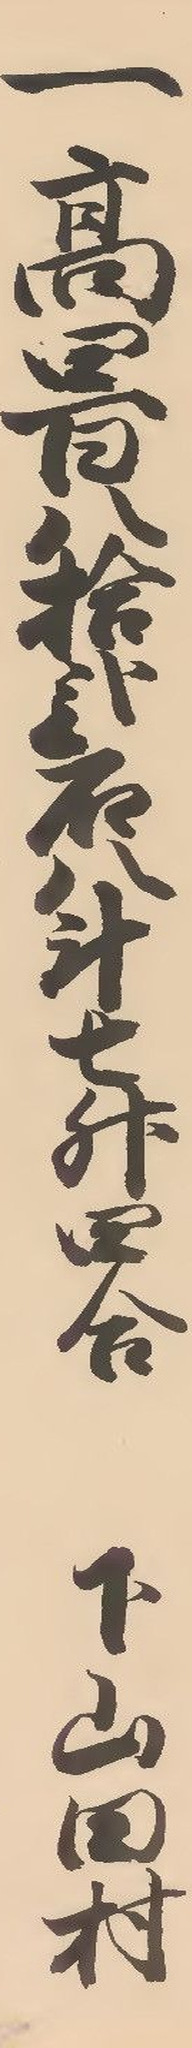一高四百八拾弐石八斗七升四合下山田村
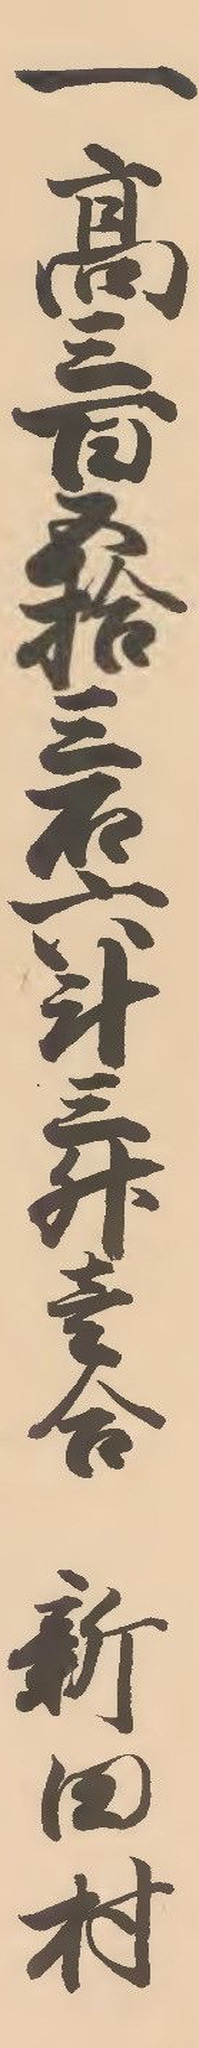一高三百五拾三石六斗三升壱合新田村
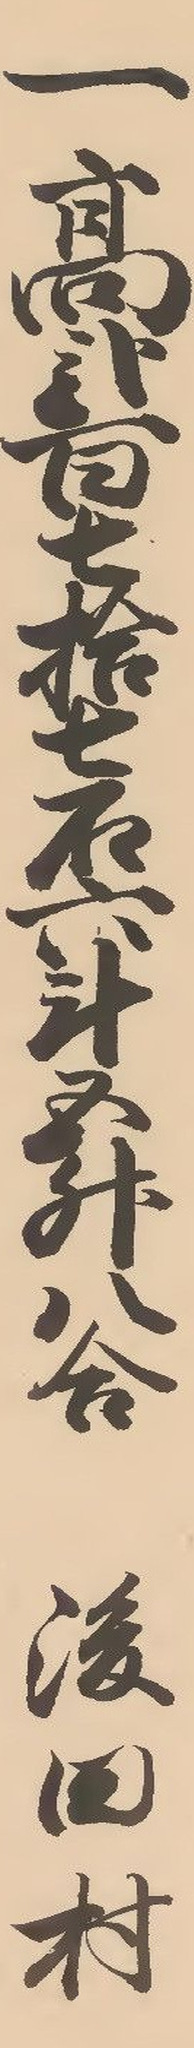一高弐百七拾七石六斗五升八合後田村
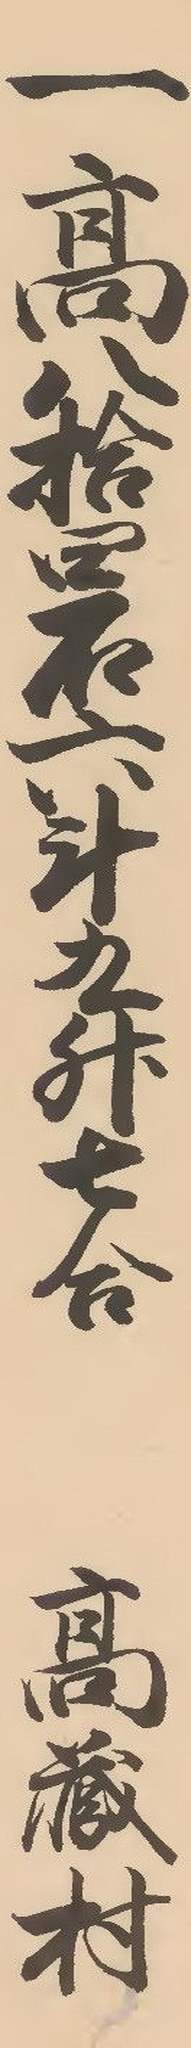一高八拾四石六斗九升七合高蔵村
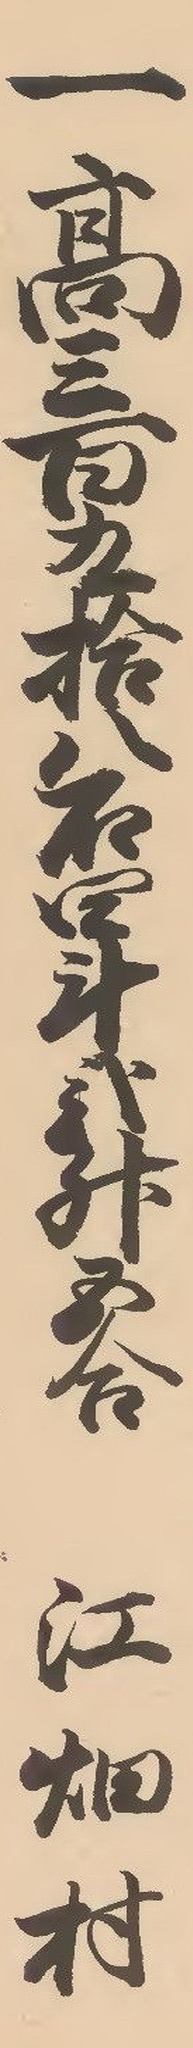一高三百九拾八石四斗弐升五合江畑村

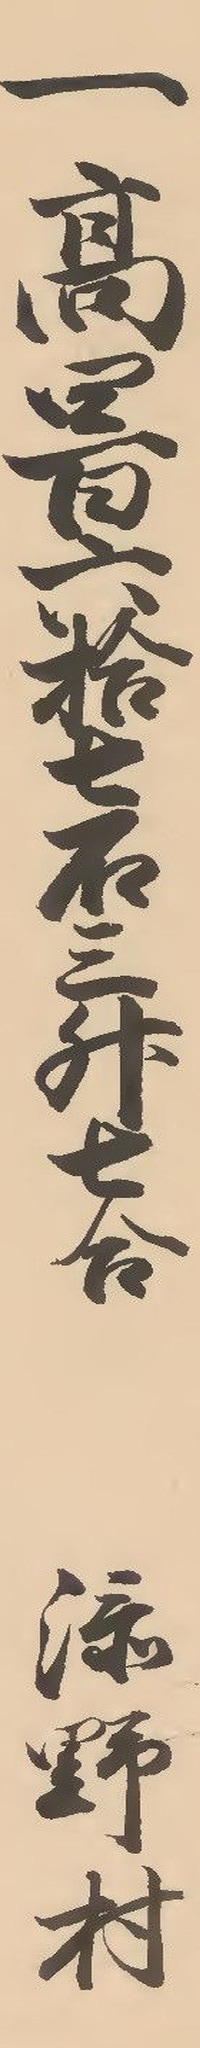一高四百六拾七石三升七合添野村
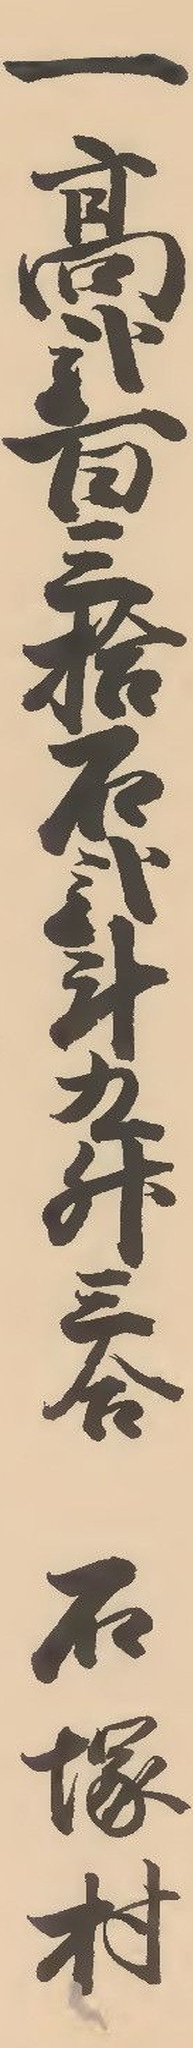一高弐百三拾石弐斗九升三合石塚村
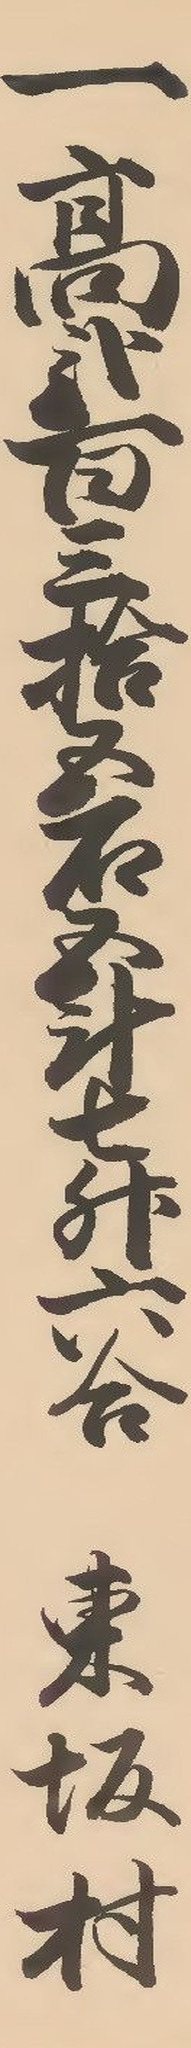一高弐百三拾五石五斗七升六合東坂村
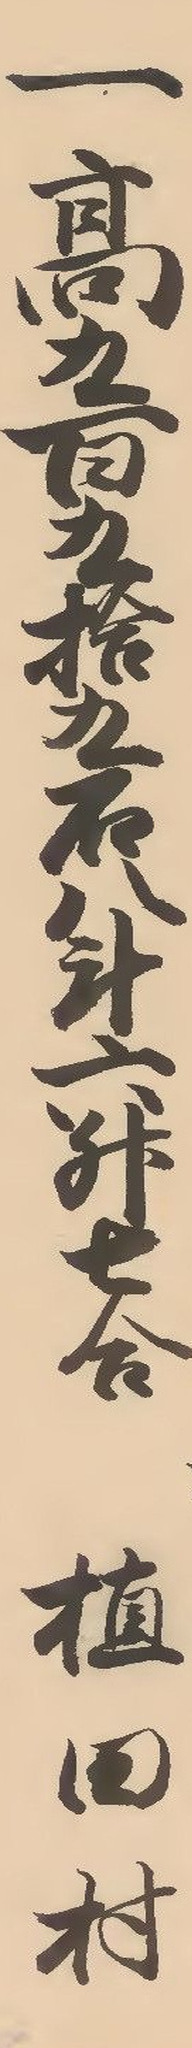一高九百九拾九石八斗六升七合植田村
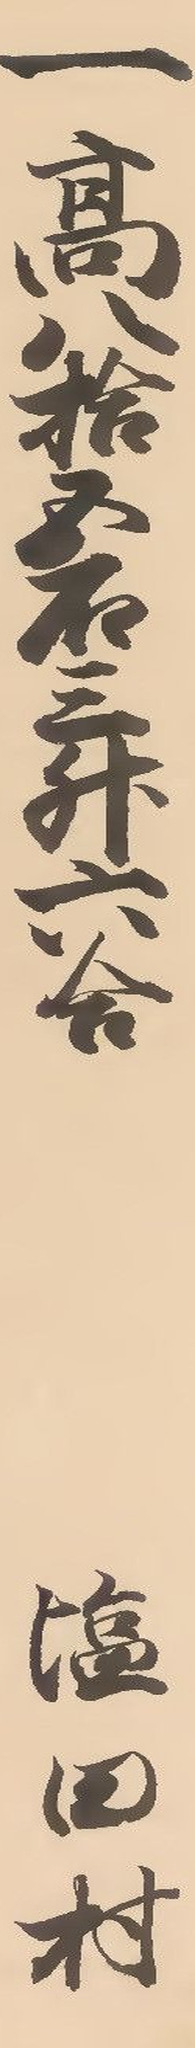一高八拾五石三升六合塩田村
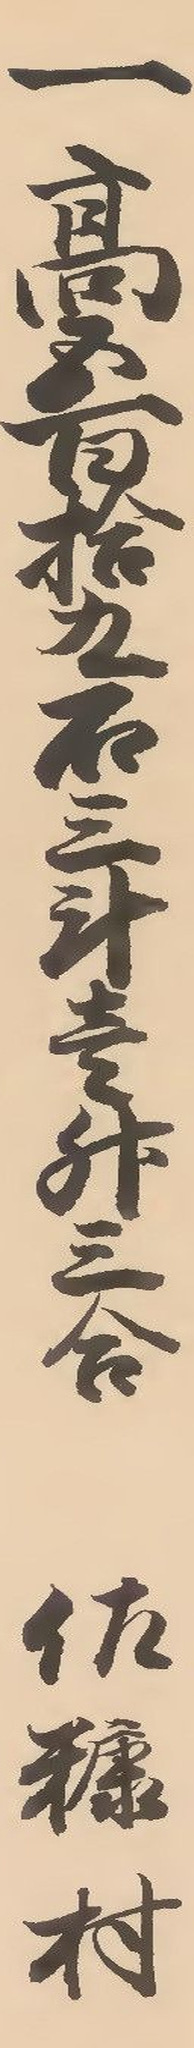一高五百拾九石三斗壱升三合佐糠村
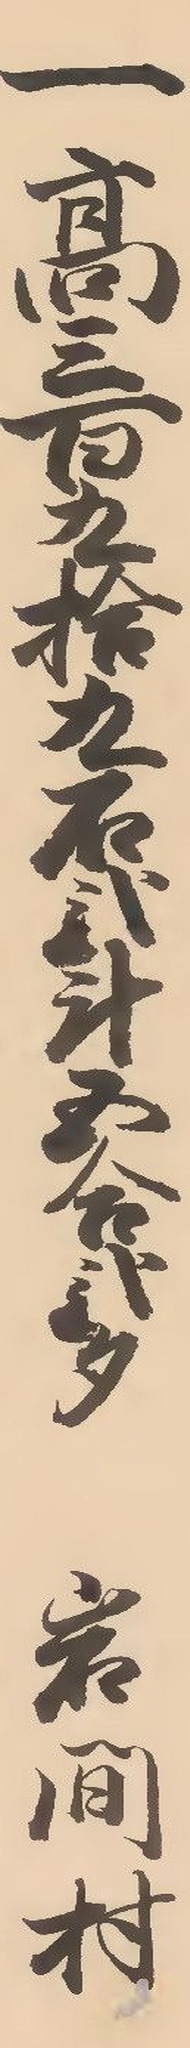一高三百九拾九石弐斗五合弐勺岩間村
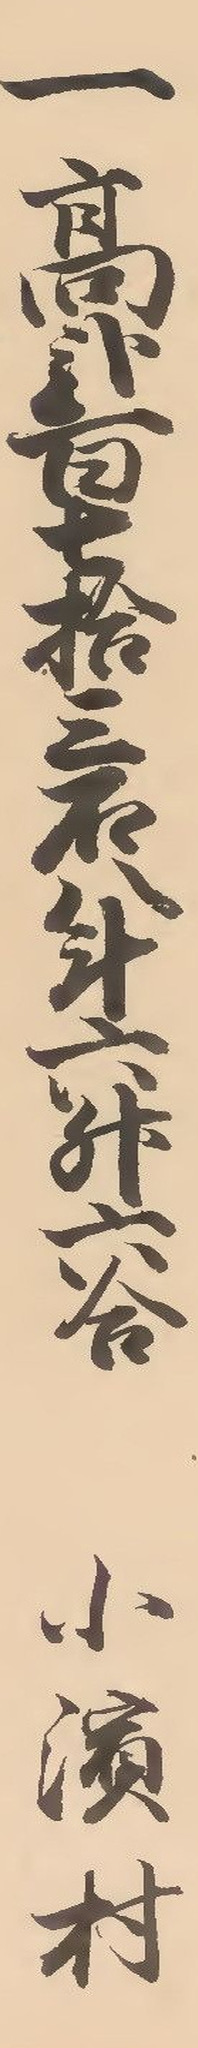一高弐百七拾三石八斗六升六合小浜村
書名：陸奥国郷帳　３
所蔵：国立公文書館 National Archives of Japan
